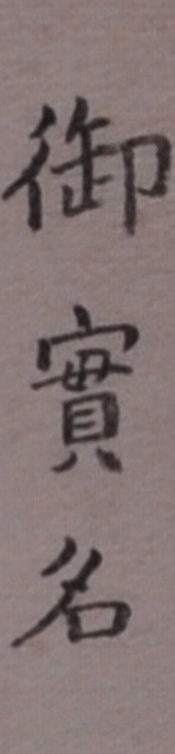御実名

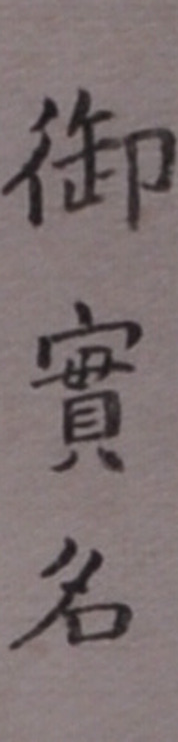御実名
